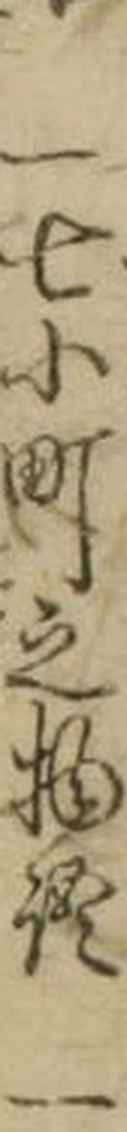一七小町之物語
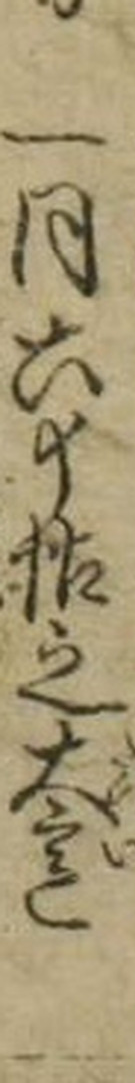一同六十帖之大意
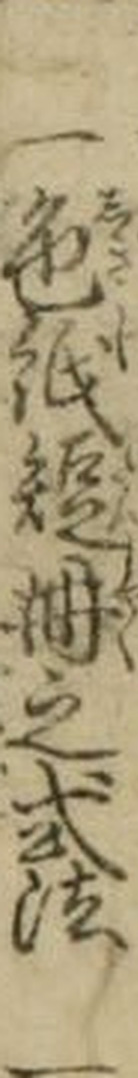一色紙短冊之式法
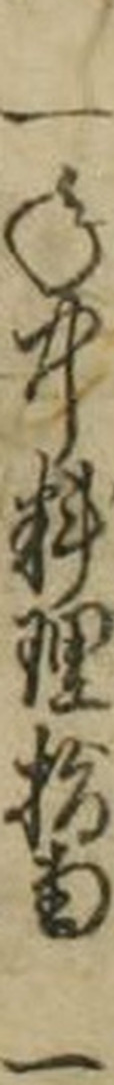一年中料理指南
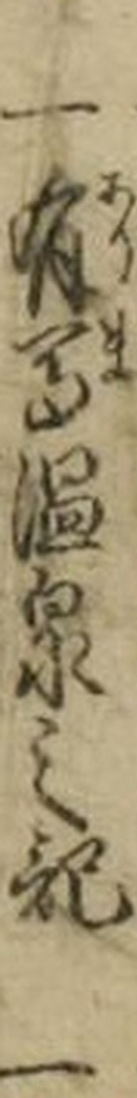一有馬温泉之記
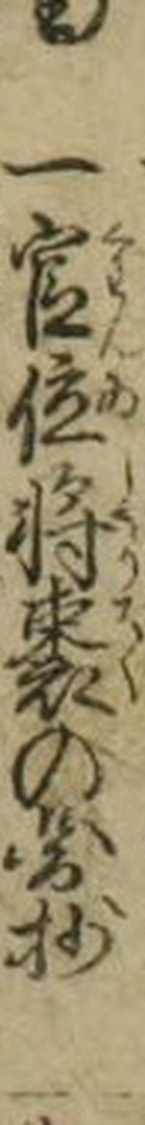一官位將の図抄
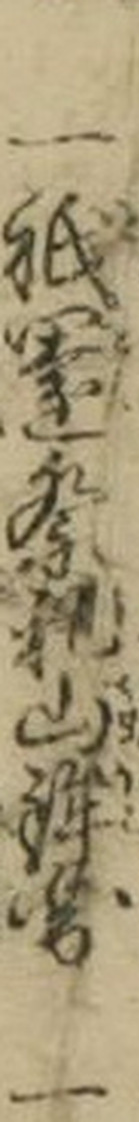一祇園祭礼山鉾図
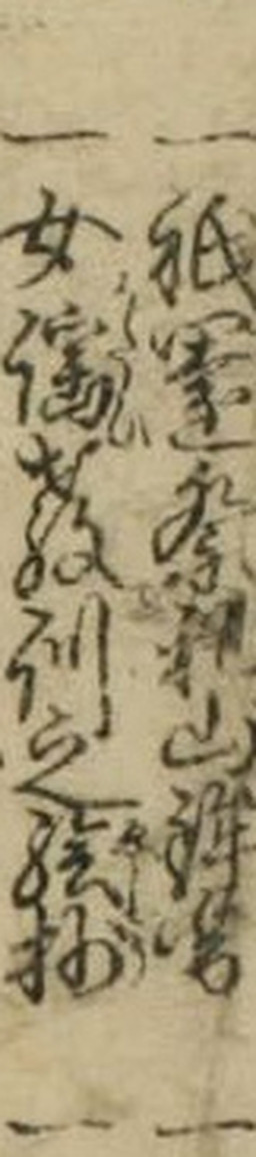一女謡教訓之絵抄
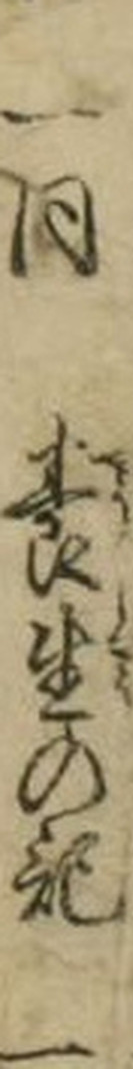一同養生の記
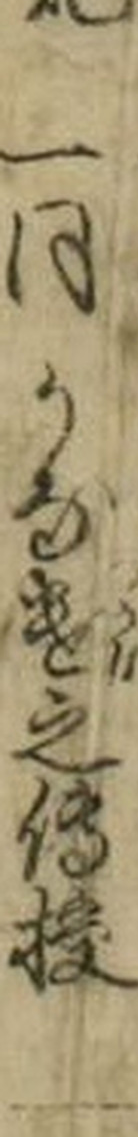一同かな遣之伝授
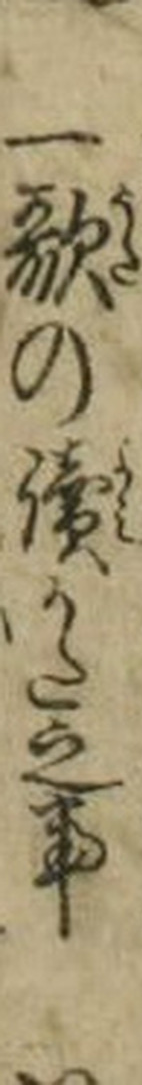一歌の読かた之事
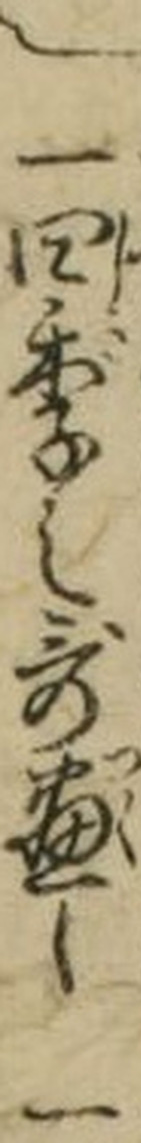一四季之歌尽し
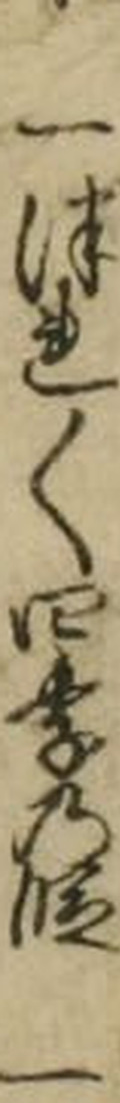一つれ〳〵四季の段
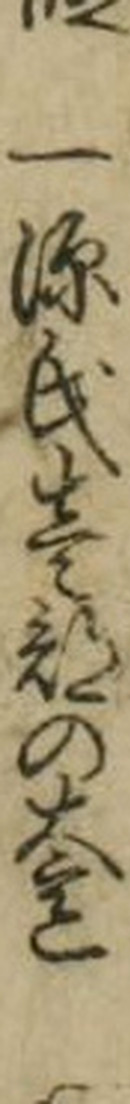一源氏壱部の大意

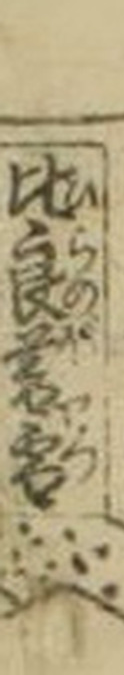比良暮雪
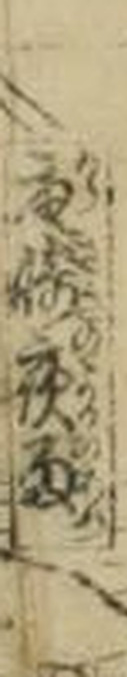唐崎夜雨
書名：女源氏教訓鑑
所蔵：東京学芸大学附属図書館
